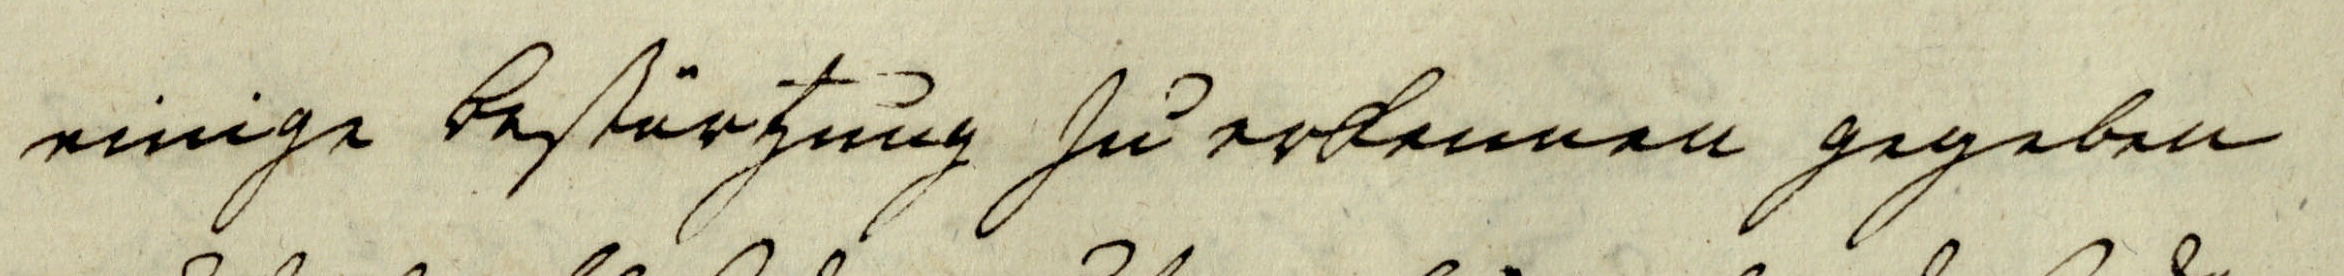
einige Bestürtzung zu erkennen gegeben
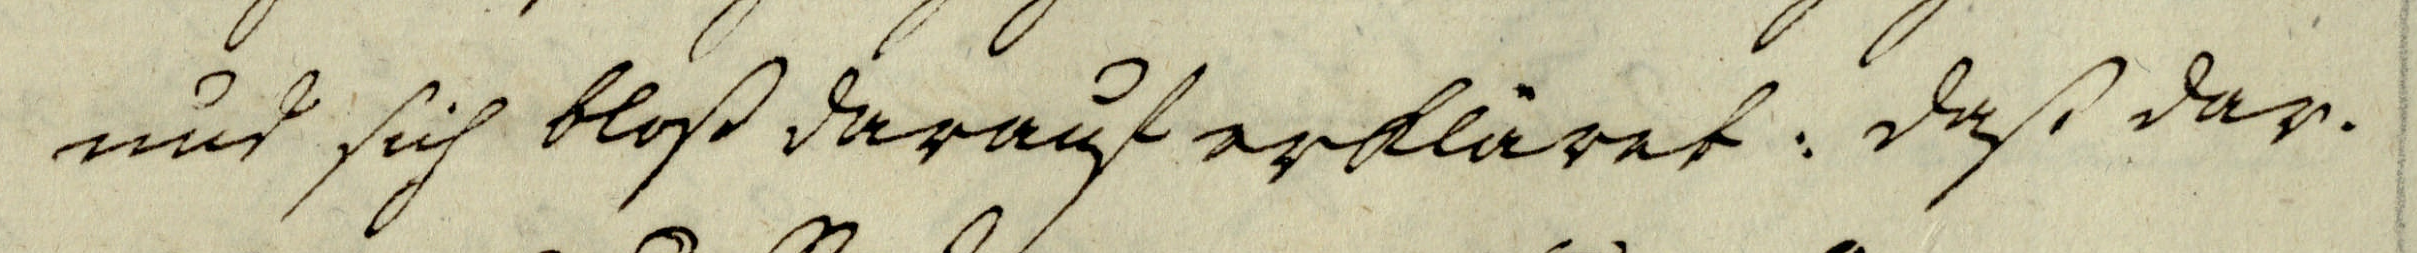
und sich bloß darauf erkläret: daß dar¬
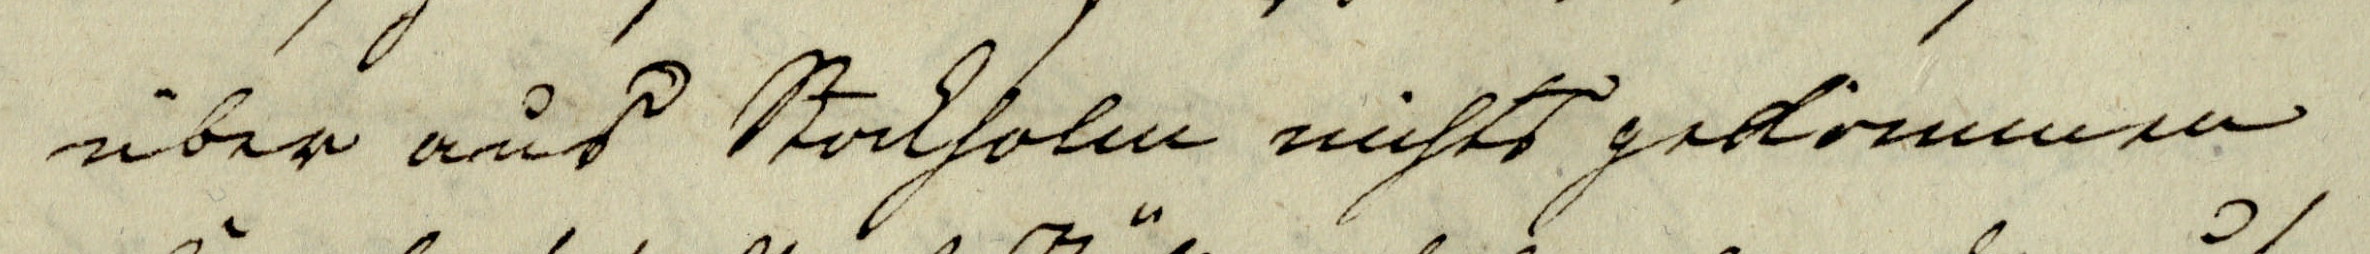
über aus Stockholm nichts gekommen
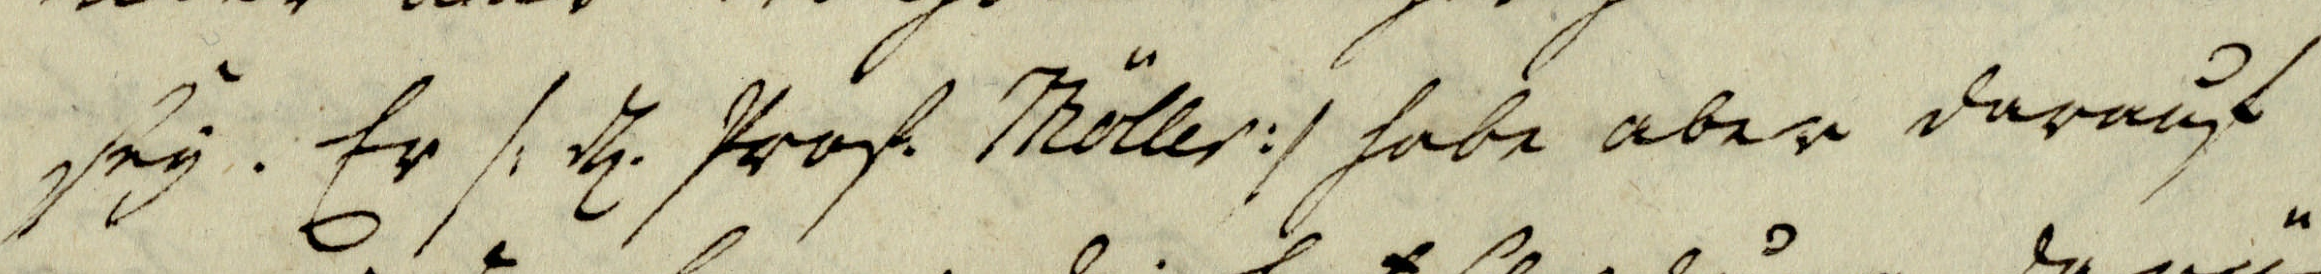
seÿ. Er /: dh. Prof. Möller :/ habe aber darauf
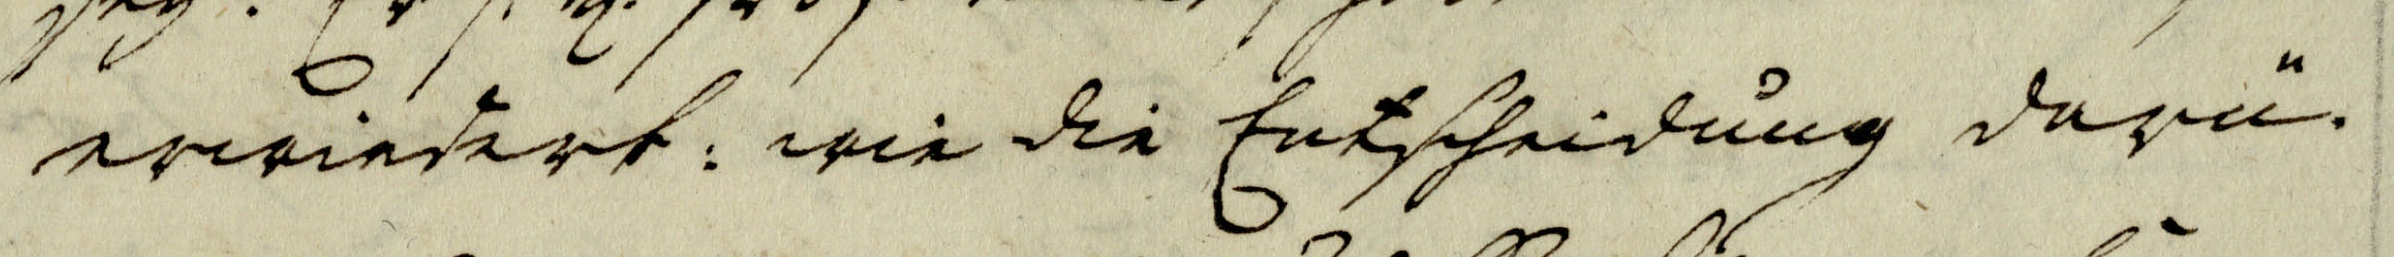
erwiedert: wie die Entscheidung darü¬
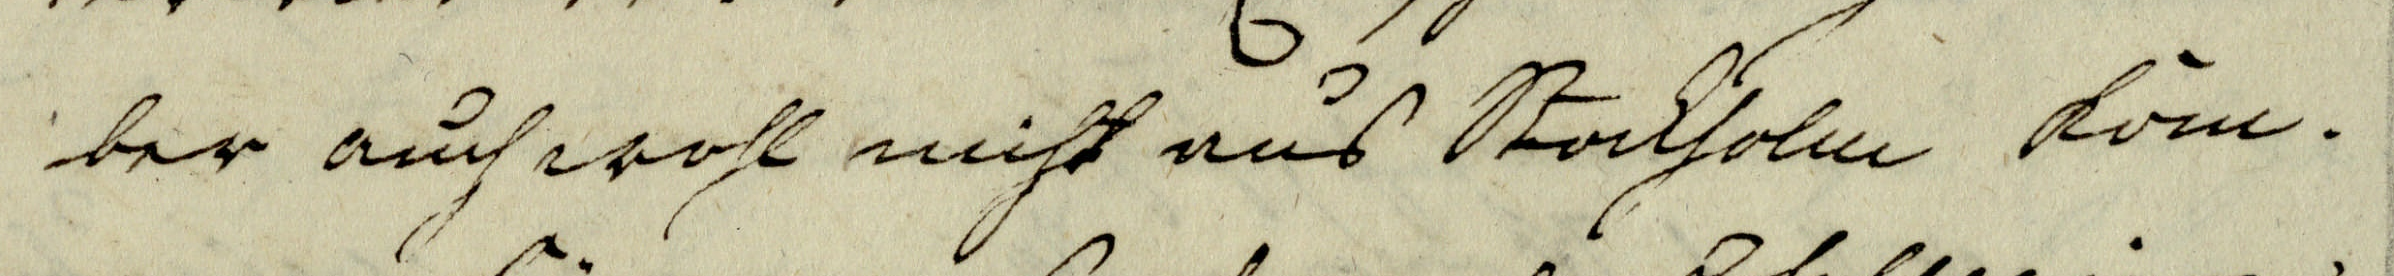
ber auch wohl nicht aus Stockholm kom¬
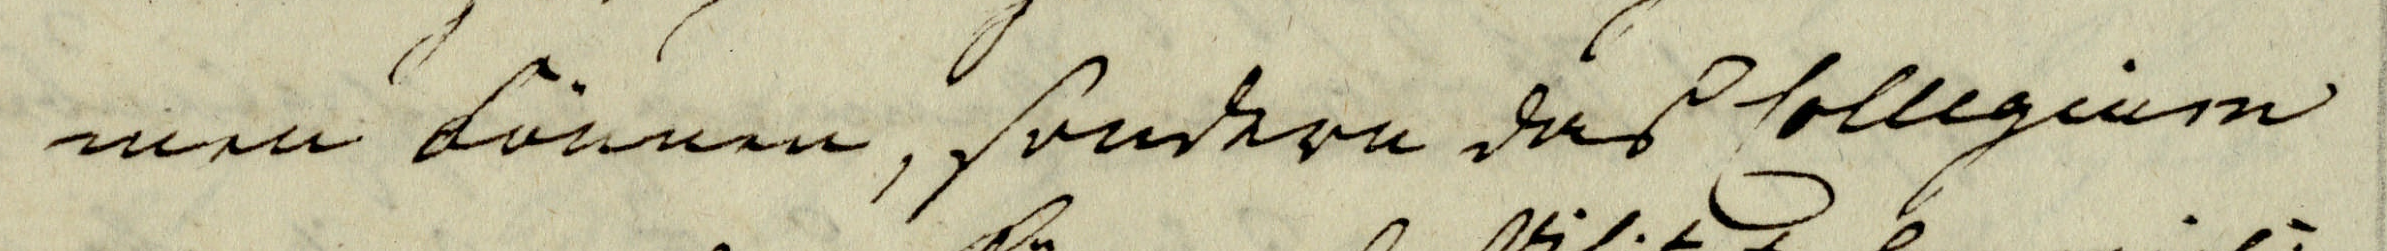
men können, sondern das Collegium
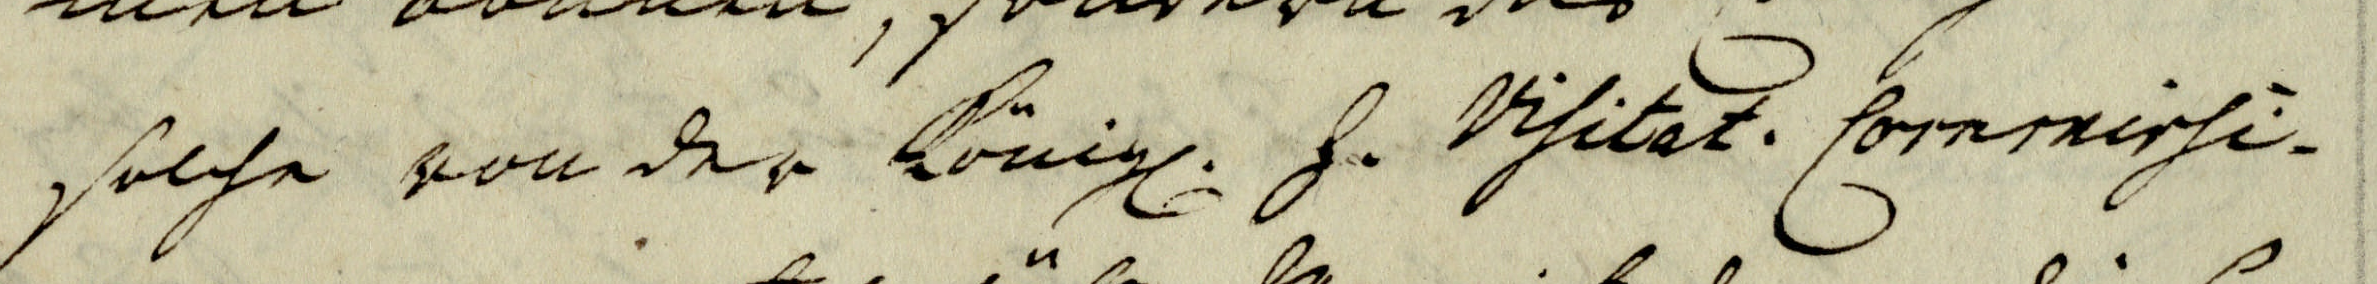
solche von der Königl. H. Visitat. Commissi¬
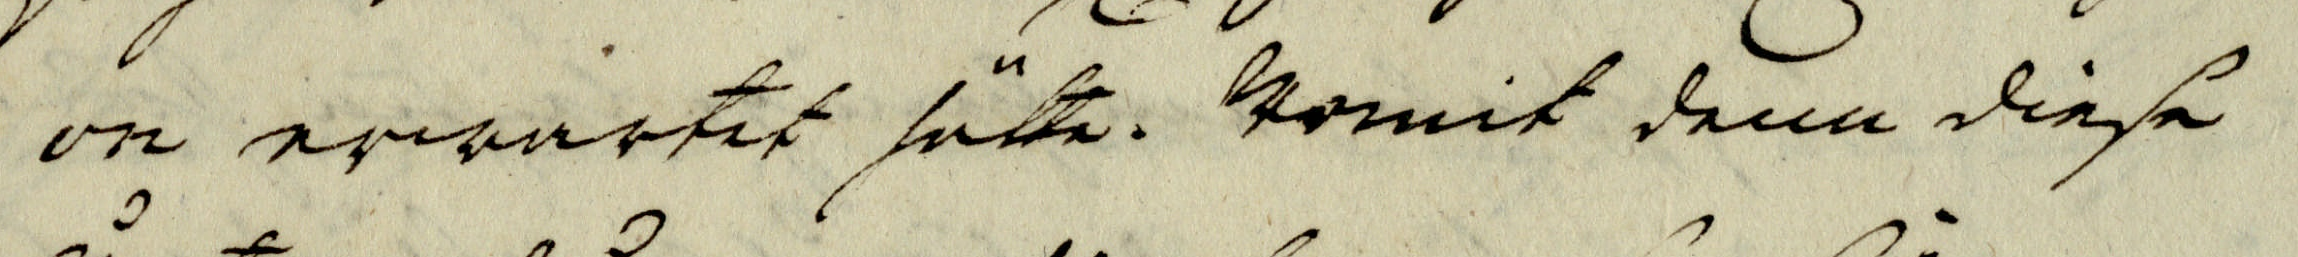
on erwartet hätte. Womit denn diese
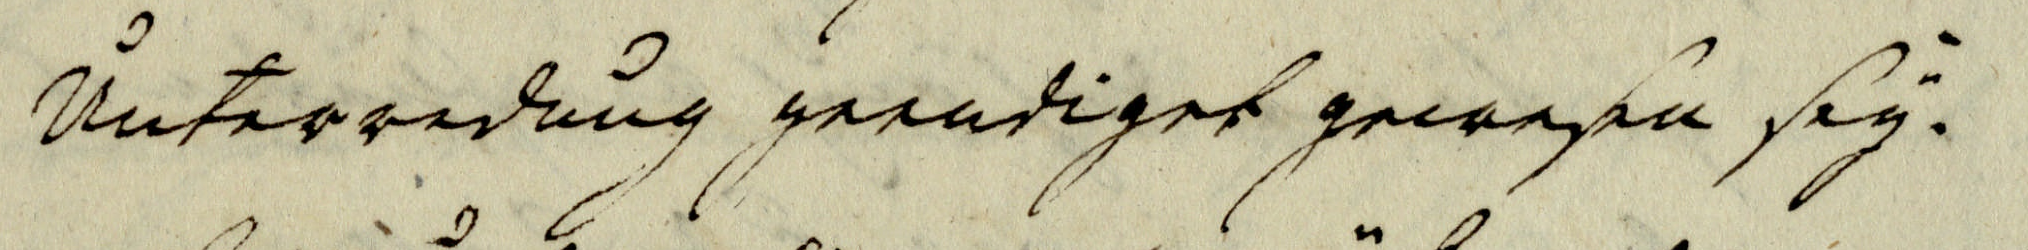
Unterredung geendiget gewesen seÿ.
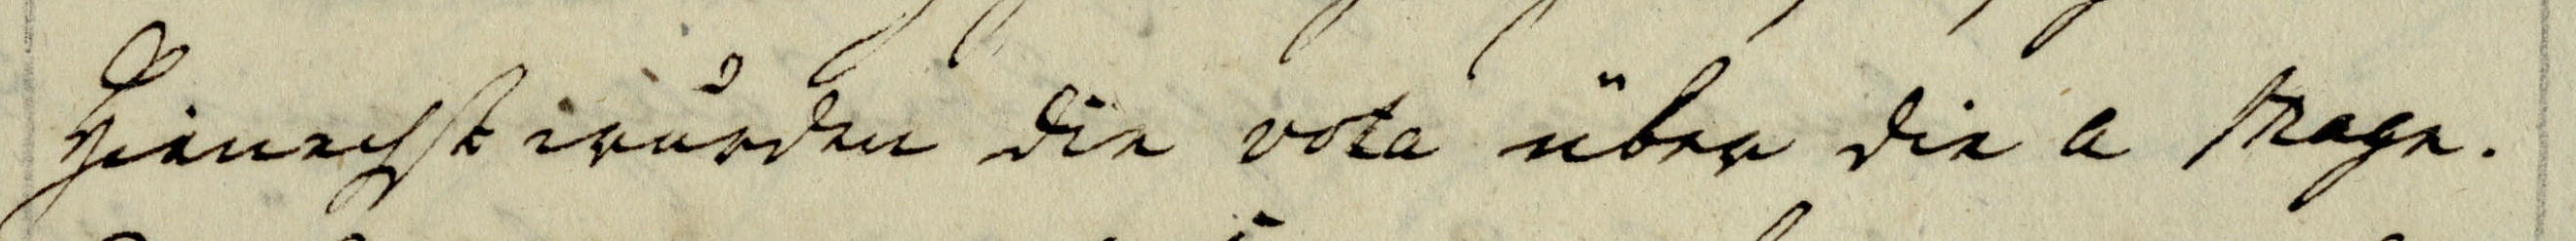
Hienechst wurden die vota über die a Magn.
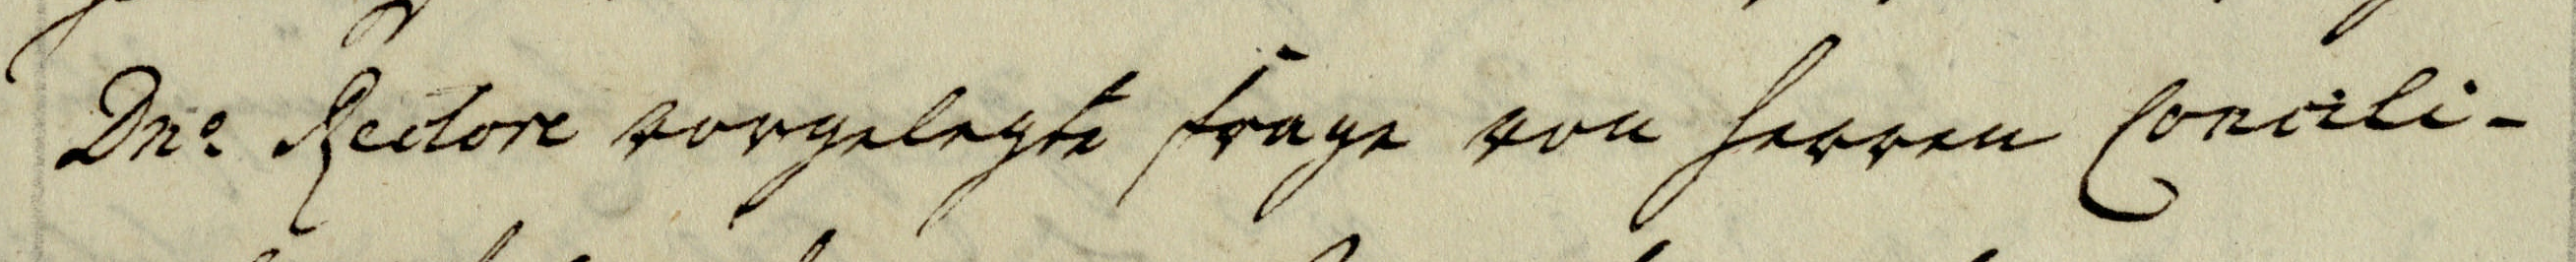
Dn. Rectore vorgelegte Frage von Herren Concili¬
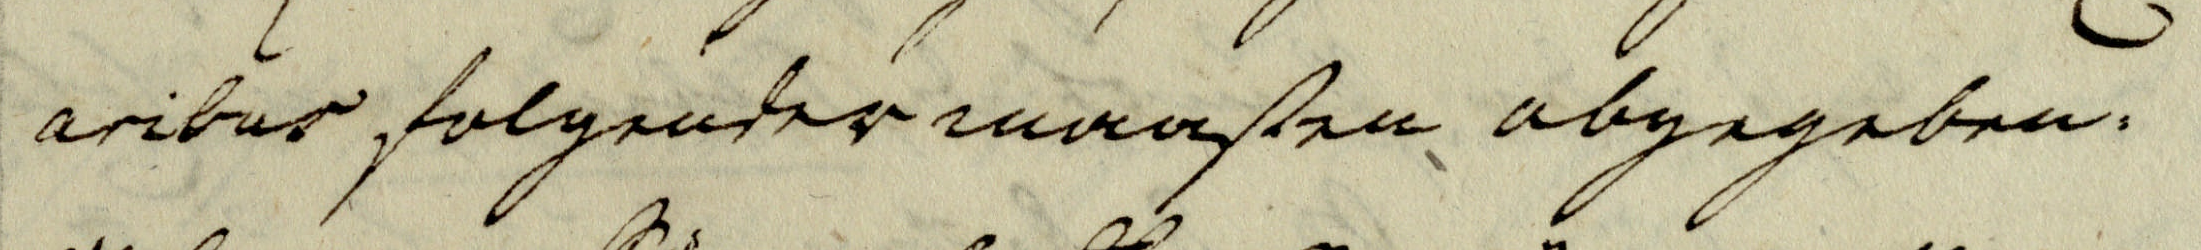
aribus folgendermaaßen abgegeben:
